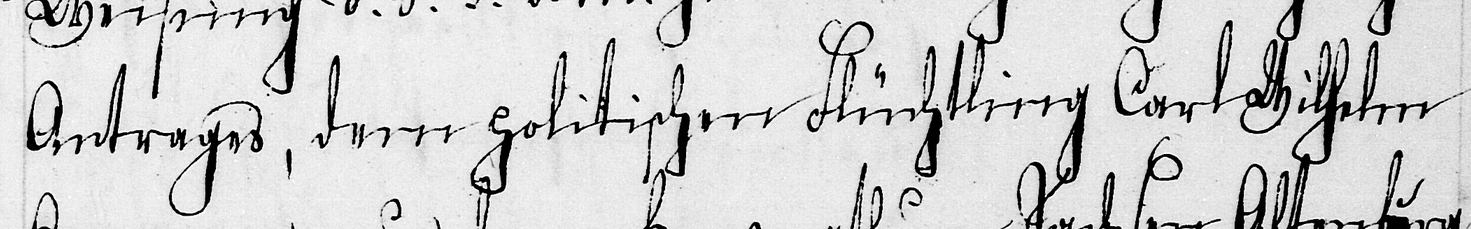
Antrages, dem politischen Flüchtling Carl Wilhelm
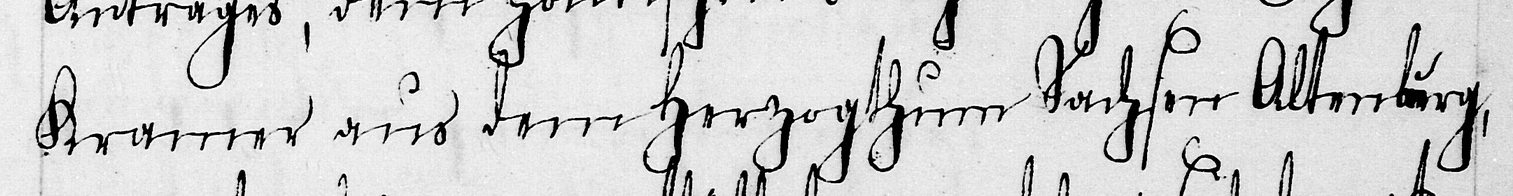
Kramer aus dem Herzogthum Sachen Altenburg,
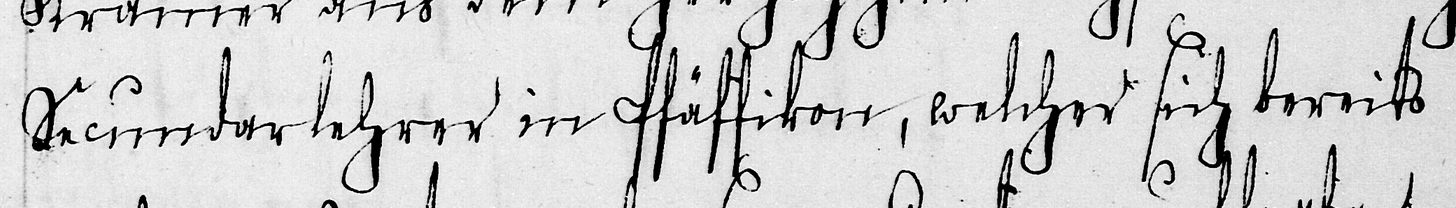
Secundarlehrer in Pfäffikon, welcher sich bereits
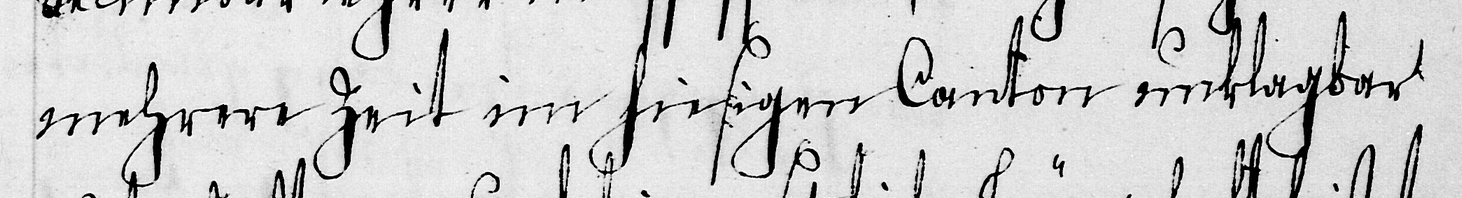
mehrere Zeit im hiesigen Canton unklagbar
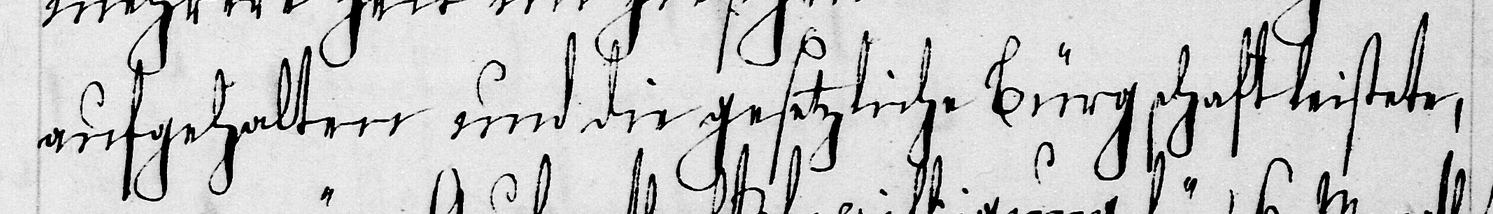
aufgehalten und die gesetzliche Bürgschaft leistete,
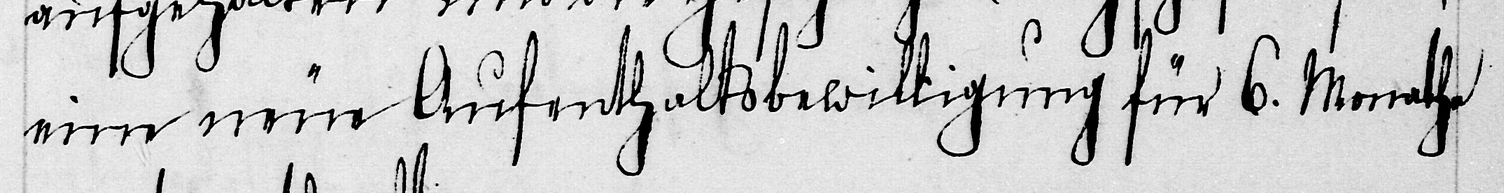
eine neue Aufenthaltsbewilligung für 6. Monathe
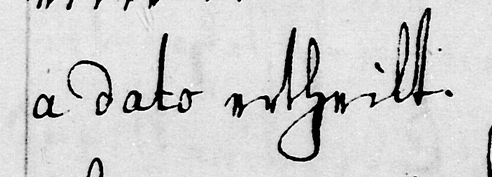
a dato ertheilt.
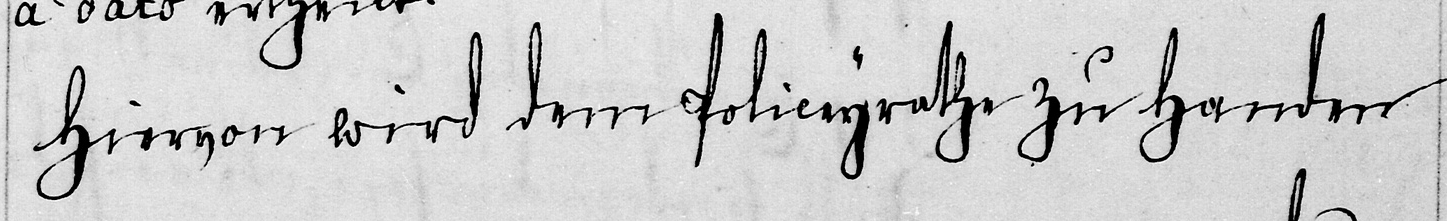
Hiervon wird dem Polizeyrathe zu Handen
